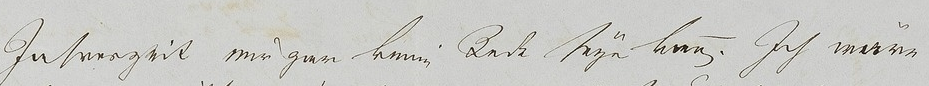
Jahreszeit nur gar keine Rede sein kann. Ich wäre
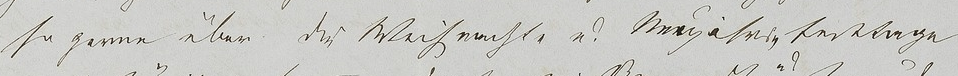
so gerne über die Weihnacht- u. Neujahrs-Festtage
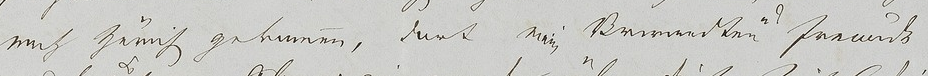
nach Zürich gekommen, dort meine Verwandten u. Freunde
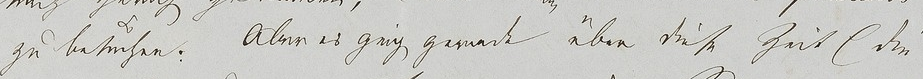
zu besuchen: Aber es ging gerade über diese Zeit (die
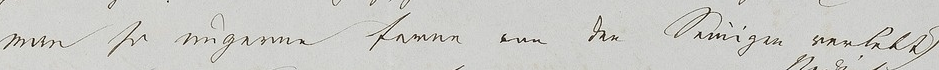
man so ungerne ferne von den Seinigen verlebt)
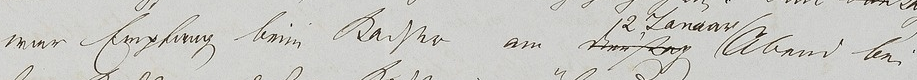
war Empfang beim Kaiser am Dienstag2 Januar Abend bei
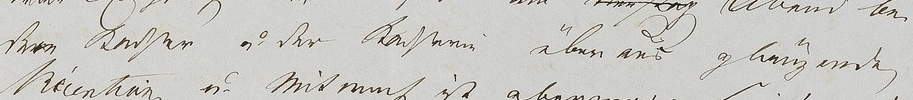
dem Kaiser u. der Kaiserin überaus glänzende
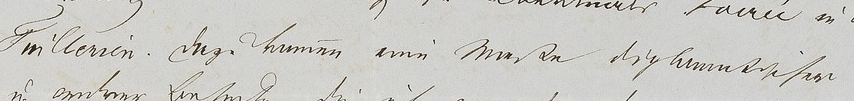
Tuillerien. Dazu kommen eine Masse diplomatischer
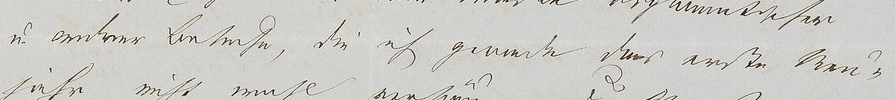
u. andrer Besuche, die ich gerade das erste Neu-
